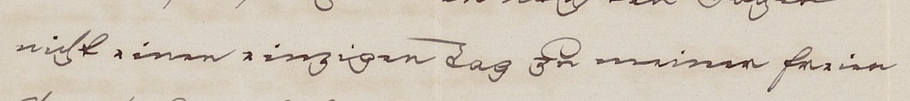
nicht einen einzigen Tag zu meiner freien
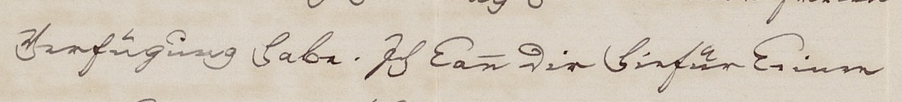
Verfügung habe. Ich kann Dir hiefür keinen
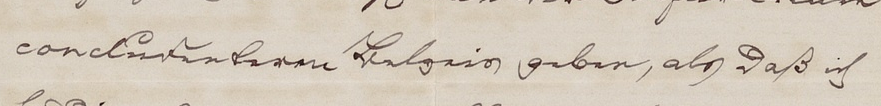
concludenteren Beweis geben, als daß ich
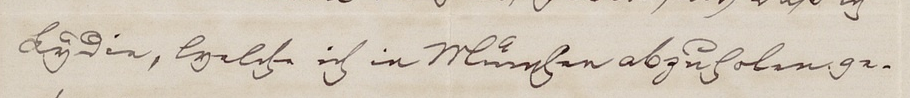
Lydie, welche ich in München abzuholen ge-
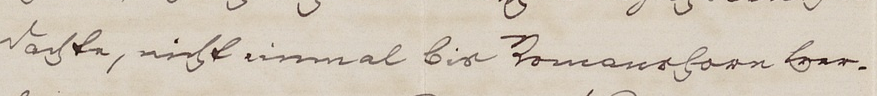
dachte, nicht einmal bis Romanshorn wer-
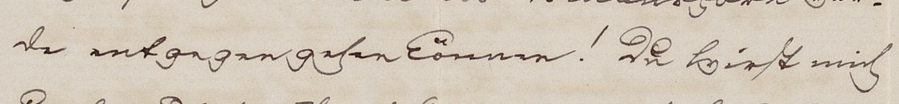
de entgegengehen können! Du wirst mich
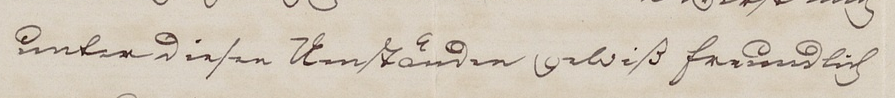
unter diesen Umständen gewiß freundlich
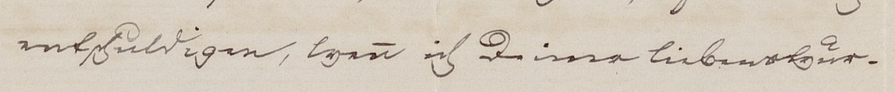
entschuldigen, wenn ich Deiner liebenswür-
